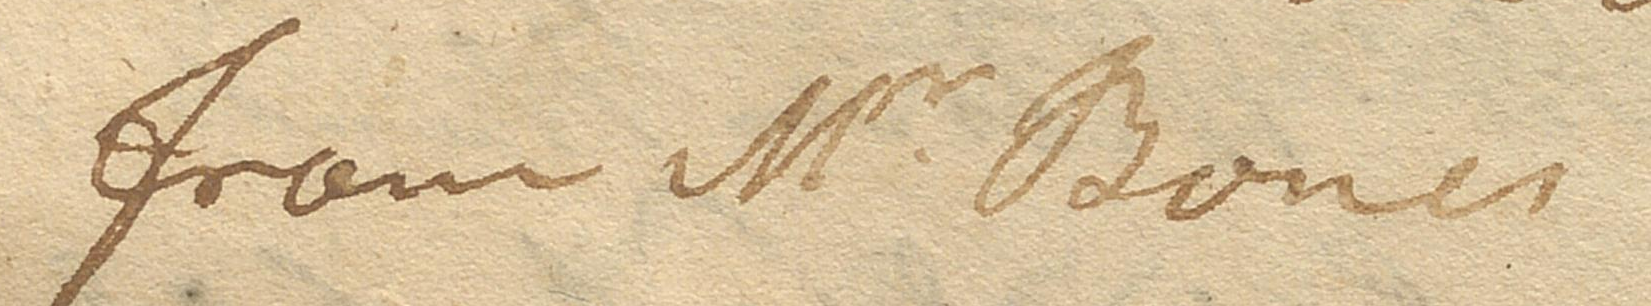from M^r. Bones
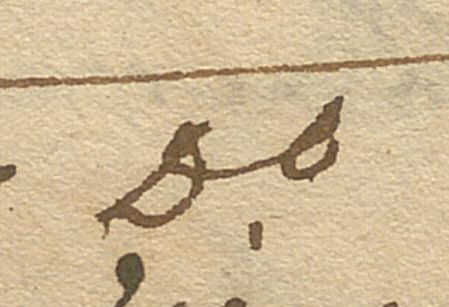D^o.
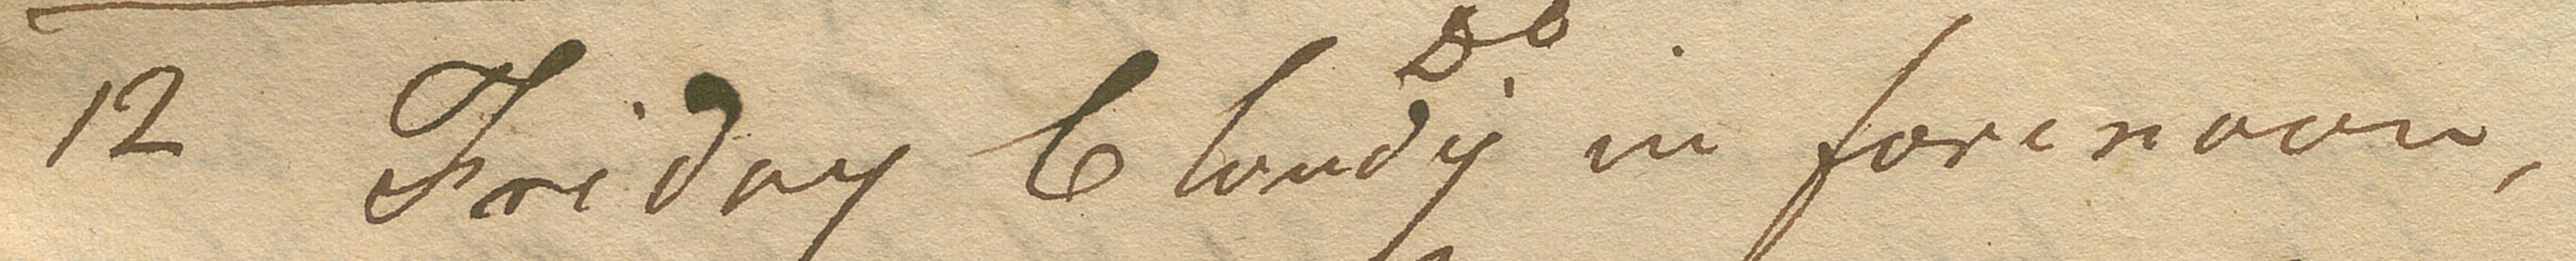12 Friday Cloudy in forenoon
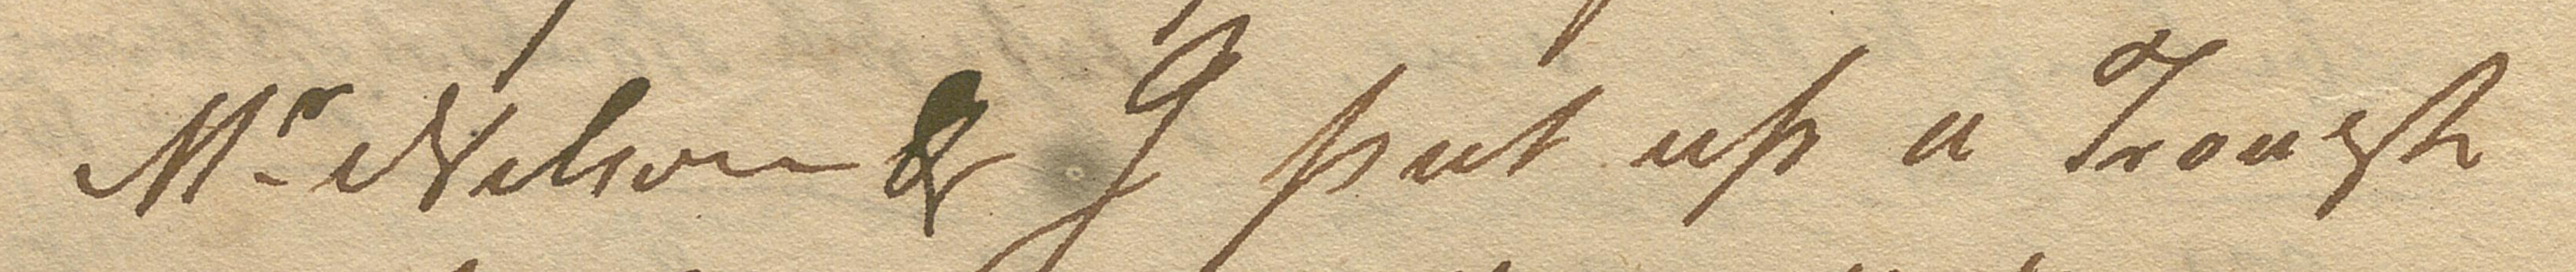M^r. Nelson & I put up a Trough
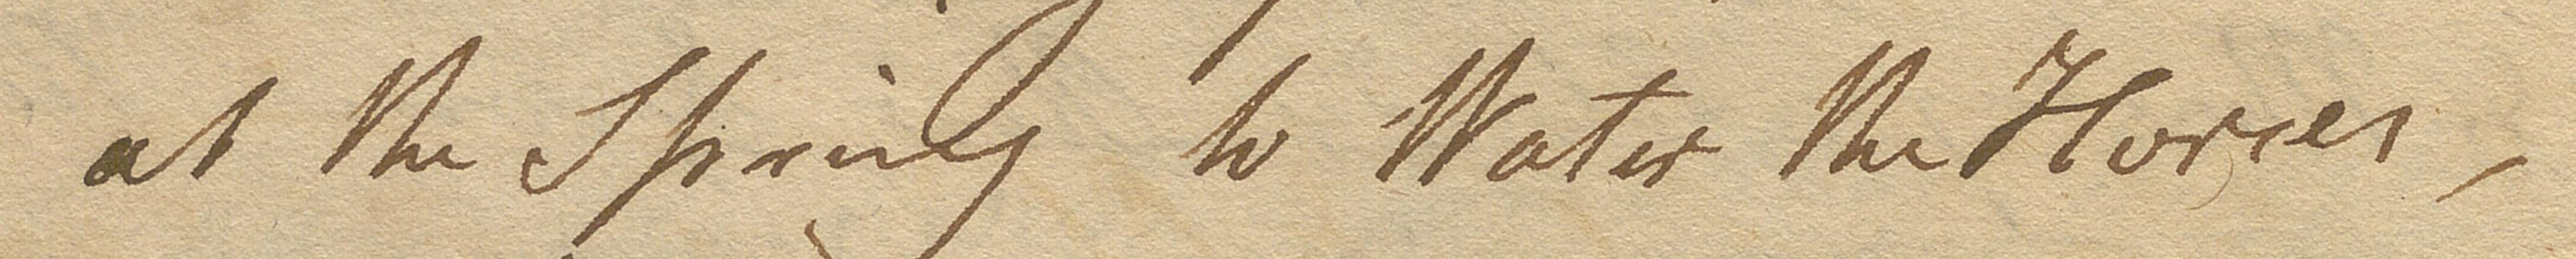at the Spring to Water the Horses,
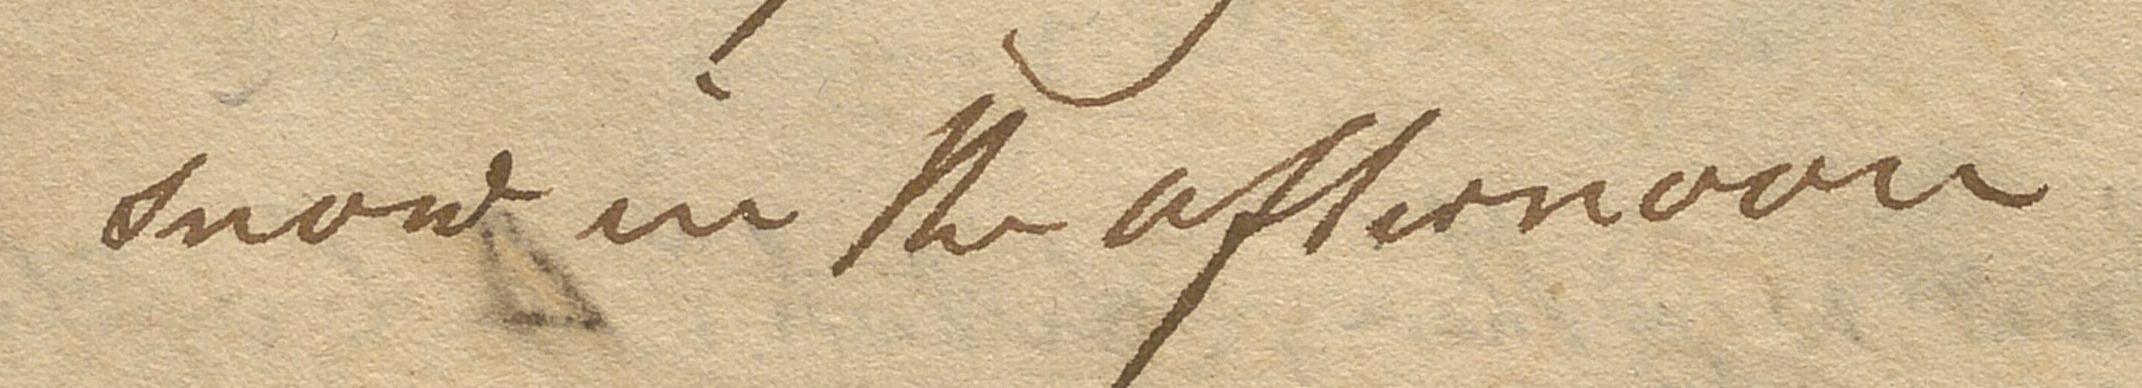snow in the afternoon
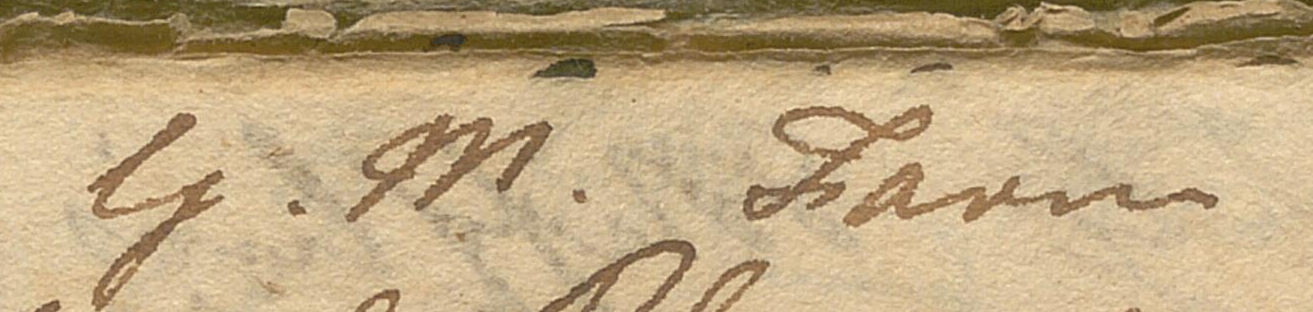G. M. Farn
